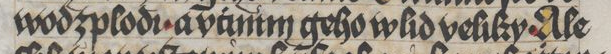wod zplodi.a vċiním geho wlid veliky.Ale
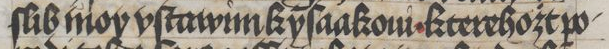ſlib moy yſtawim kyſaakoui.kterehożt po¬
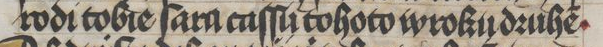rodi tobie ſara caſſij tohoto wroku druhē.
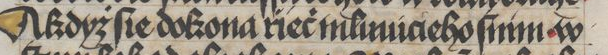A kdyż ſie dokona ṙíeċ miluuicieho ſnim.w¬
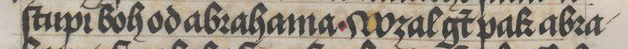ſtupi boh od abrahama.Wzal ḡt pak abra¬
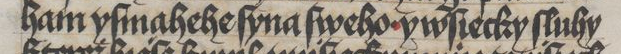haní yſmahehe ſyna ſweho.y wẛiecky ſluhy
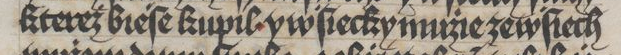ktereż bieẛe kupil.y wẛiecky mużie zewẛiech
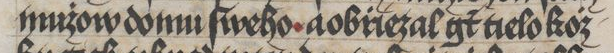mužow domu ſweho.a obṙíezal ḡt tielo koż¬
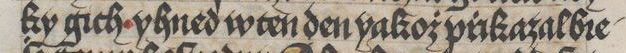ky gich.yhned wten den yakoż pṙikazal bie¬
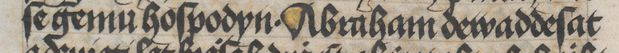ẛe gemu hoſpodyn.Abraham dewaddeſat
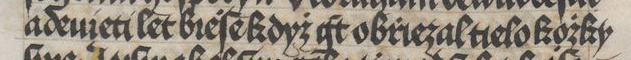adeuieti let bieẛe kdyż ḡt obṙiezal tielo kożky
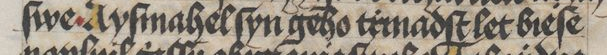ſwe.Ayſmahel ſyn geho tṙinadſt let bieẛe
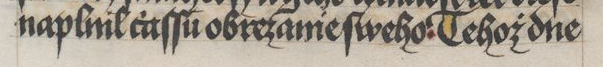naylnil ċaſſu obrezaníe ſweho.Tehoż dne
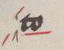to
